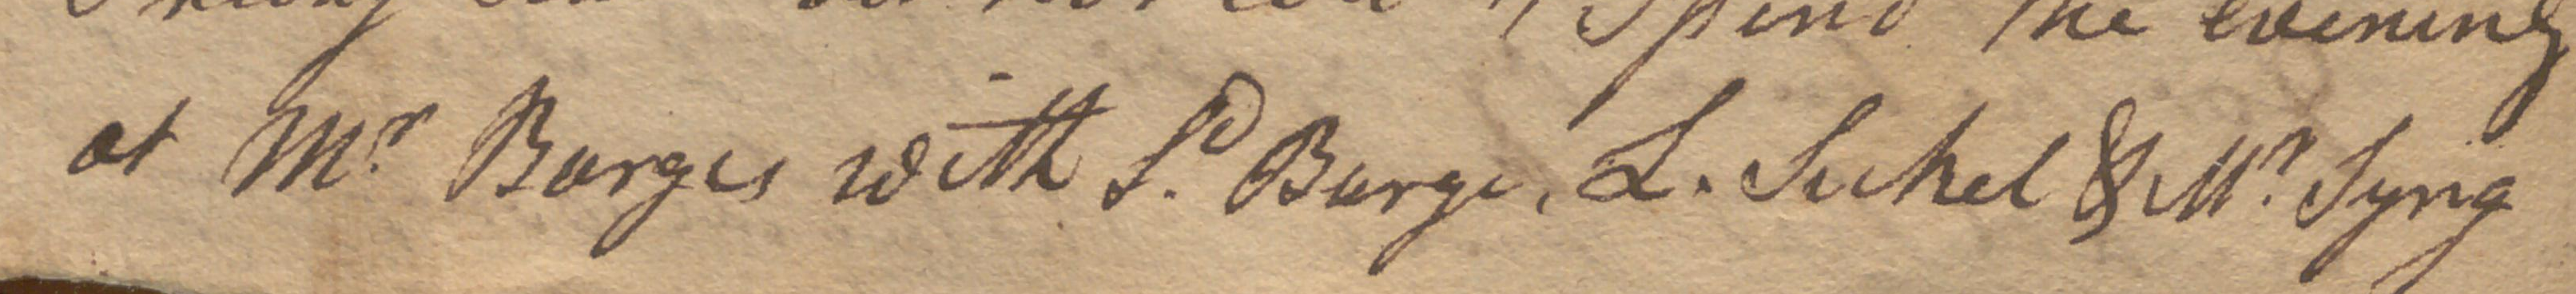at M^r. Barges with P. Barge. L. Seckel & M^r. Syng
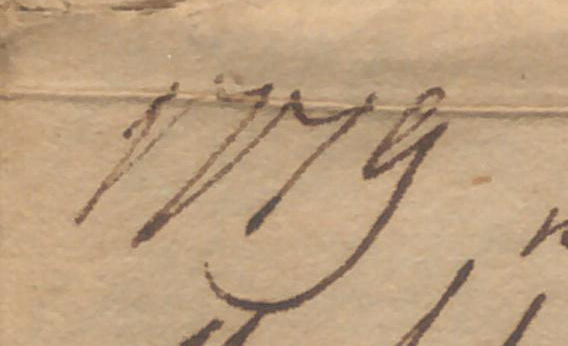1779
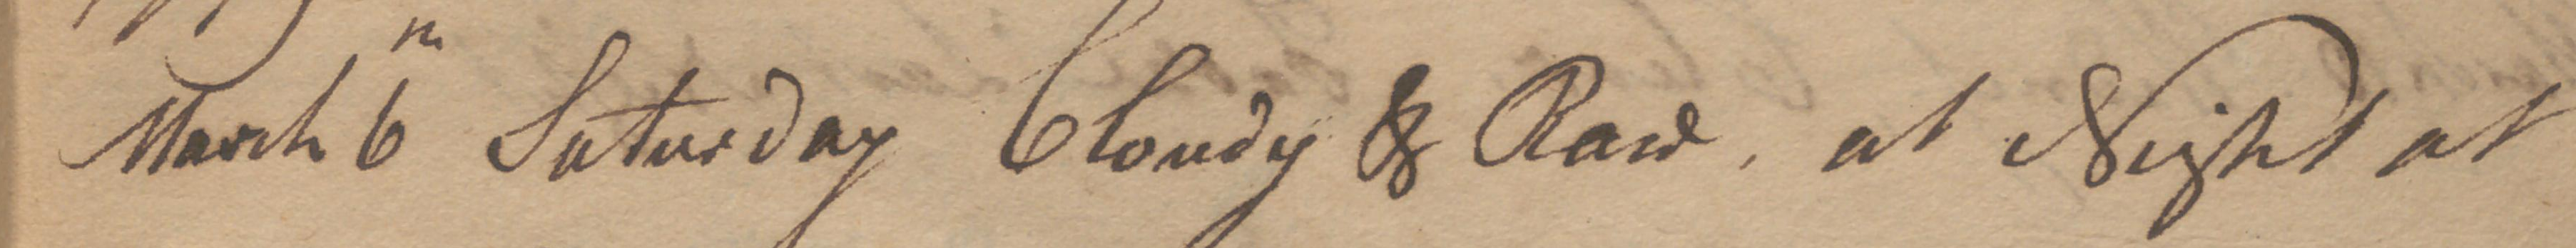March 6^th Saturday Cloudy & Raw, at Night it
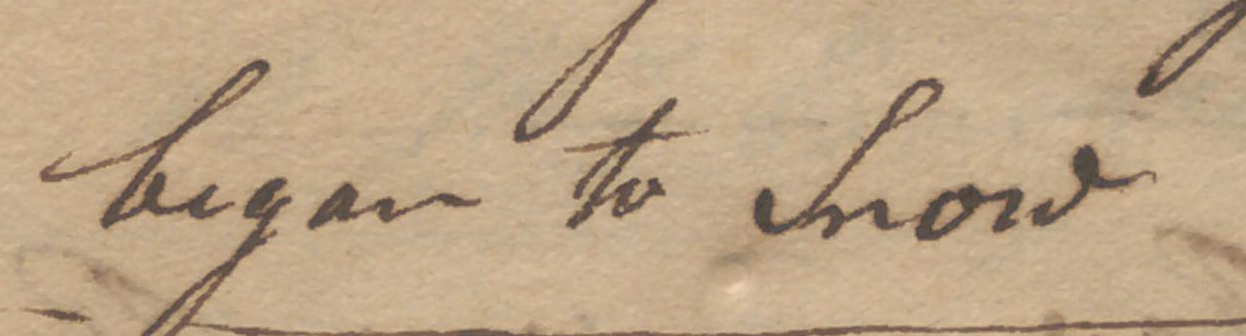began to snow
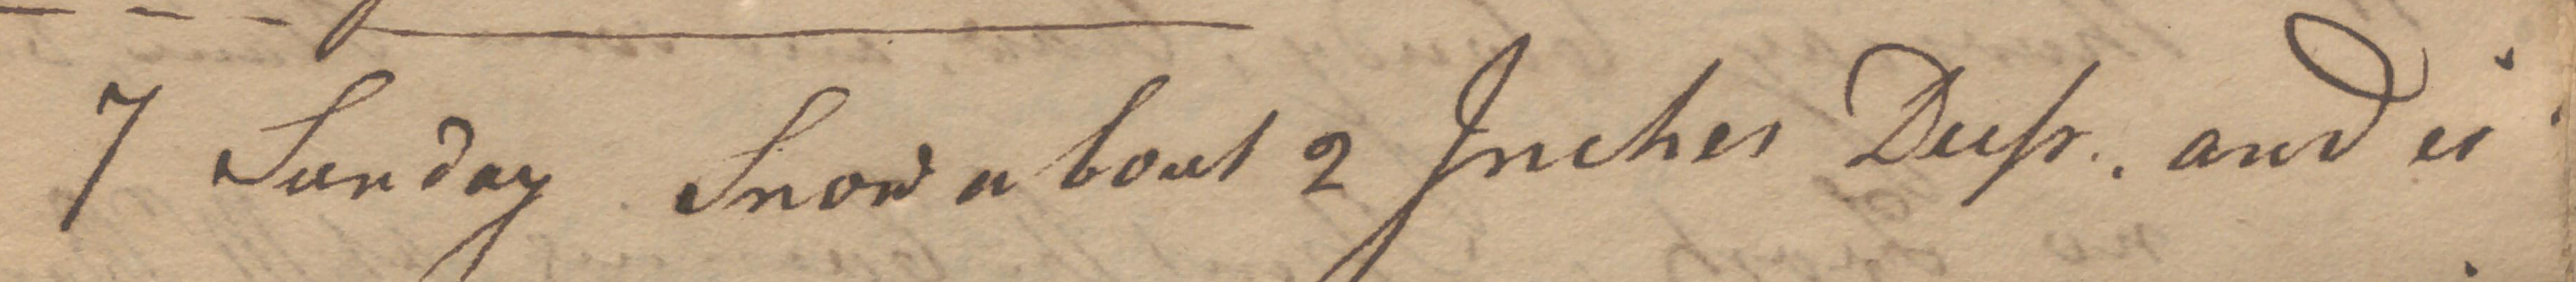7 Sunday Snow about 2 Inches Deep and is
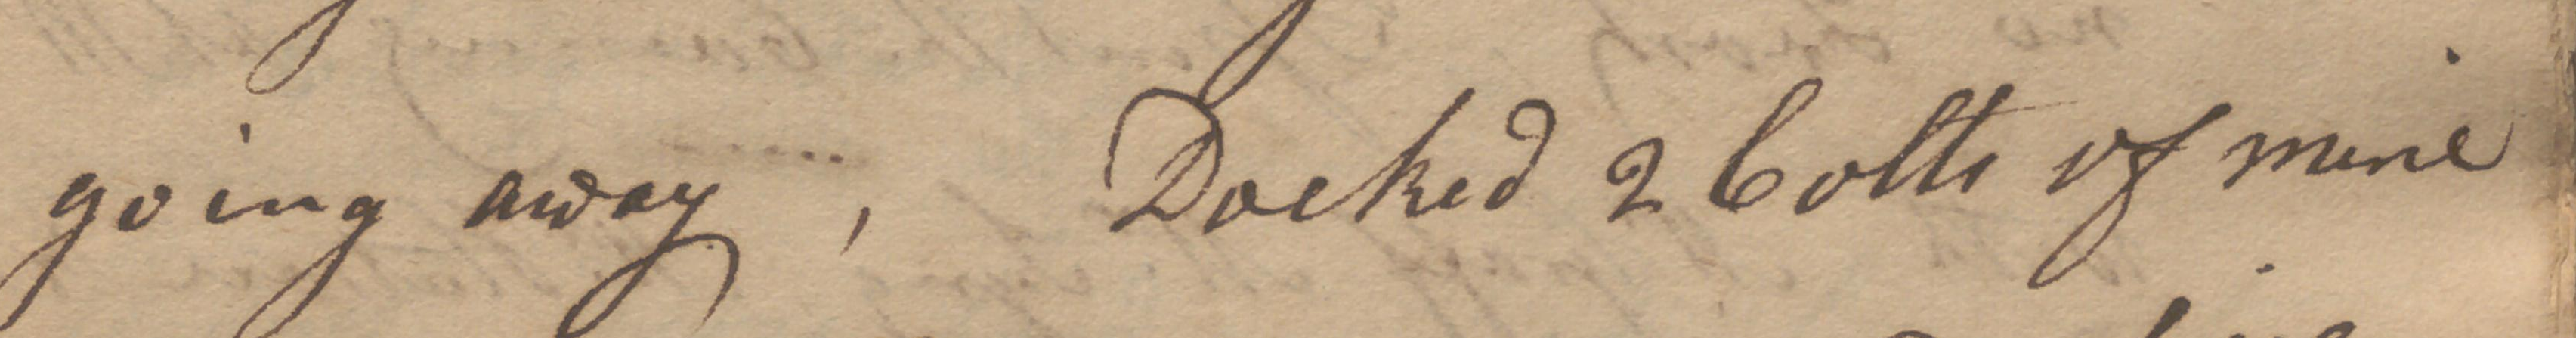going away, Docked 2 Colts of mine
